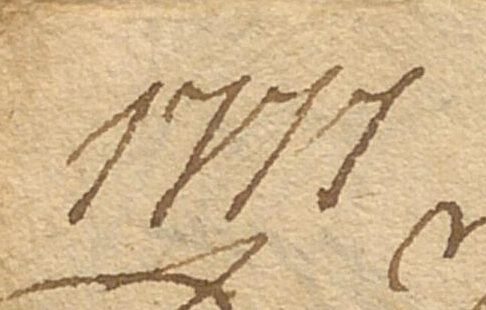1777
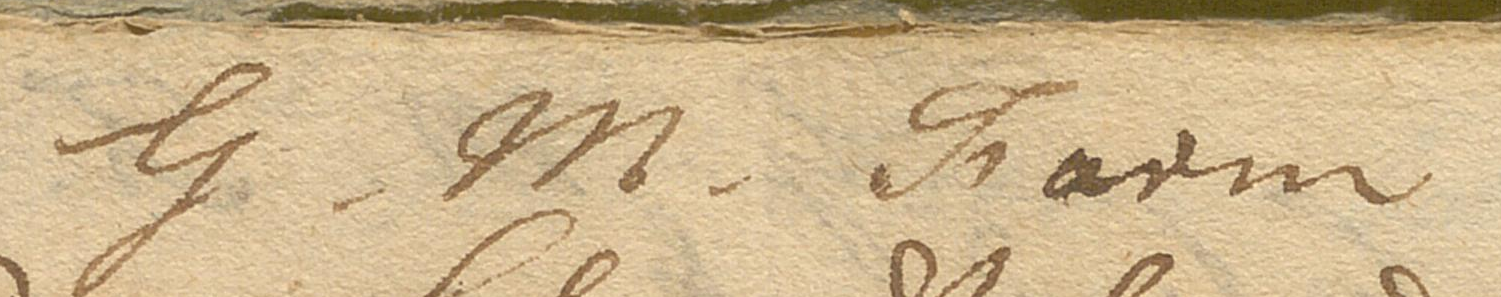G M. Farm
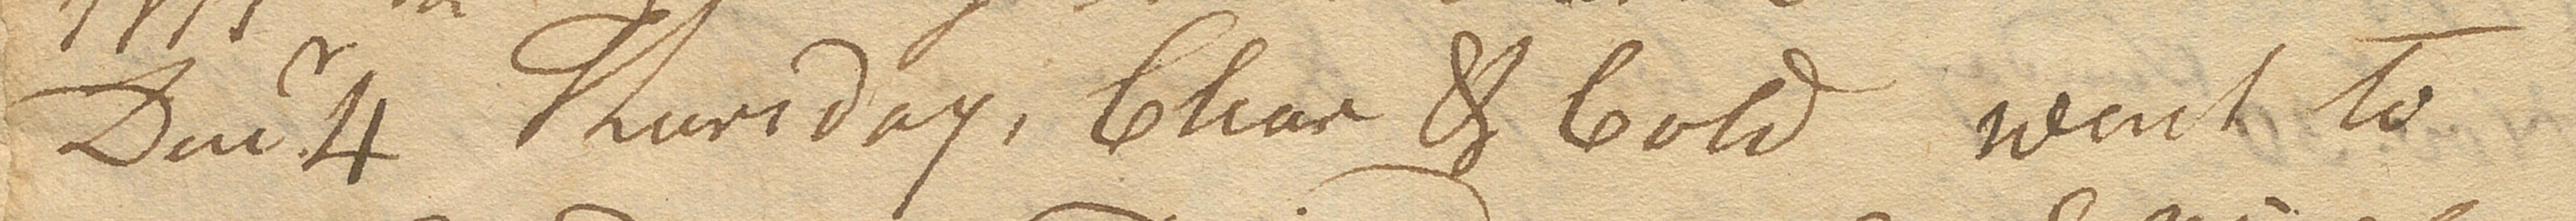Dec^r 4^th Thursday, Clear & Cold went to
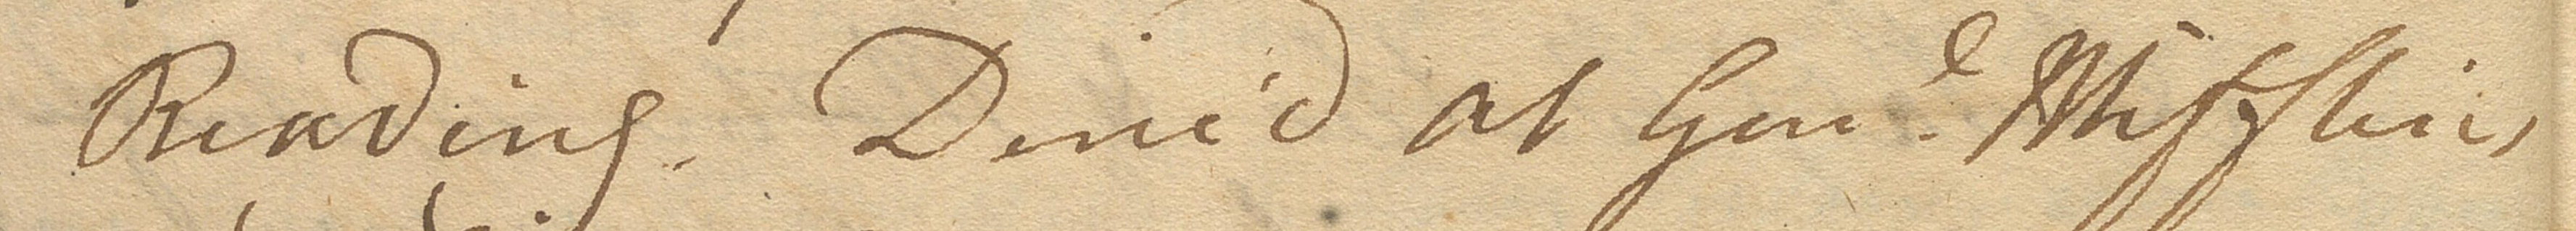Reading. Dine'd at Gen^l. Mfflins
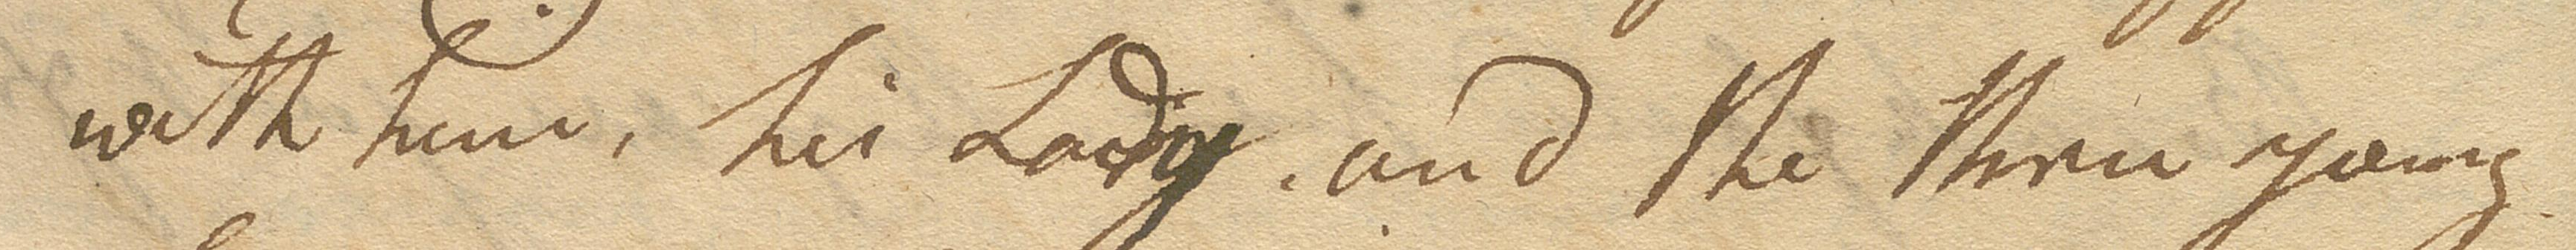with him, his Lady. and the three young
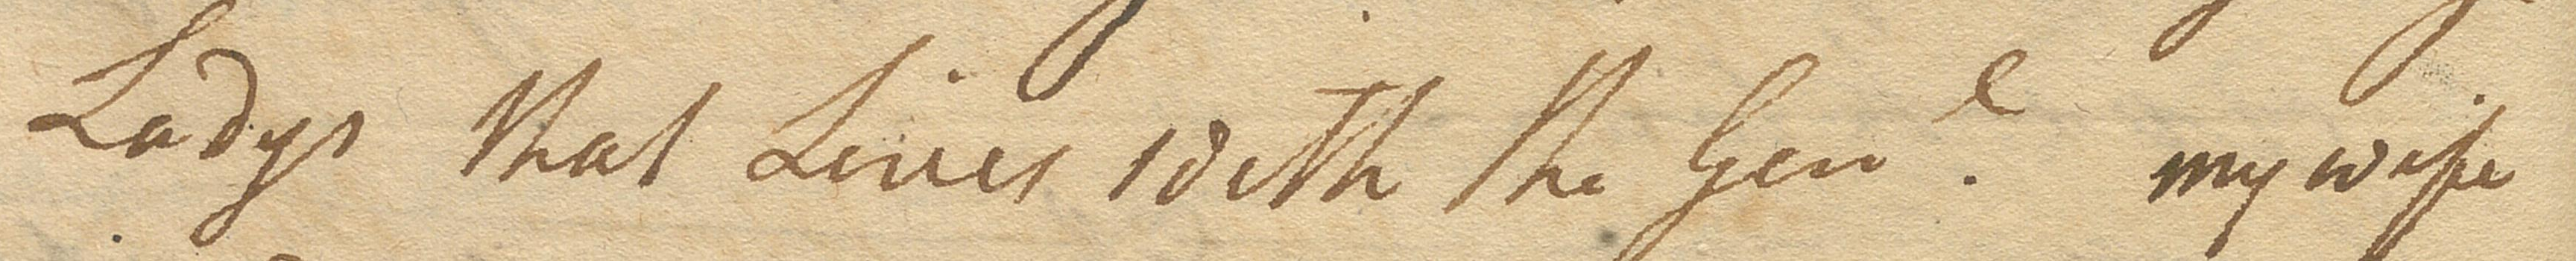Ladys that Lives with the Gen^l. my wife
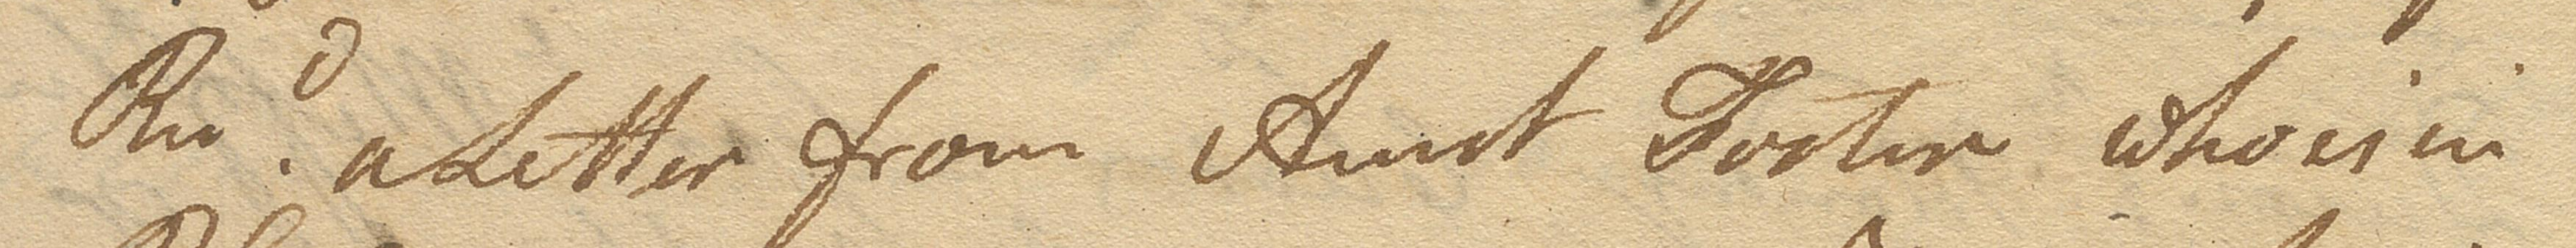Rec^d. a Letter from Aunt Foiter who is in
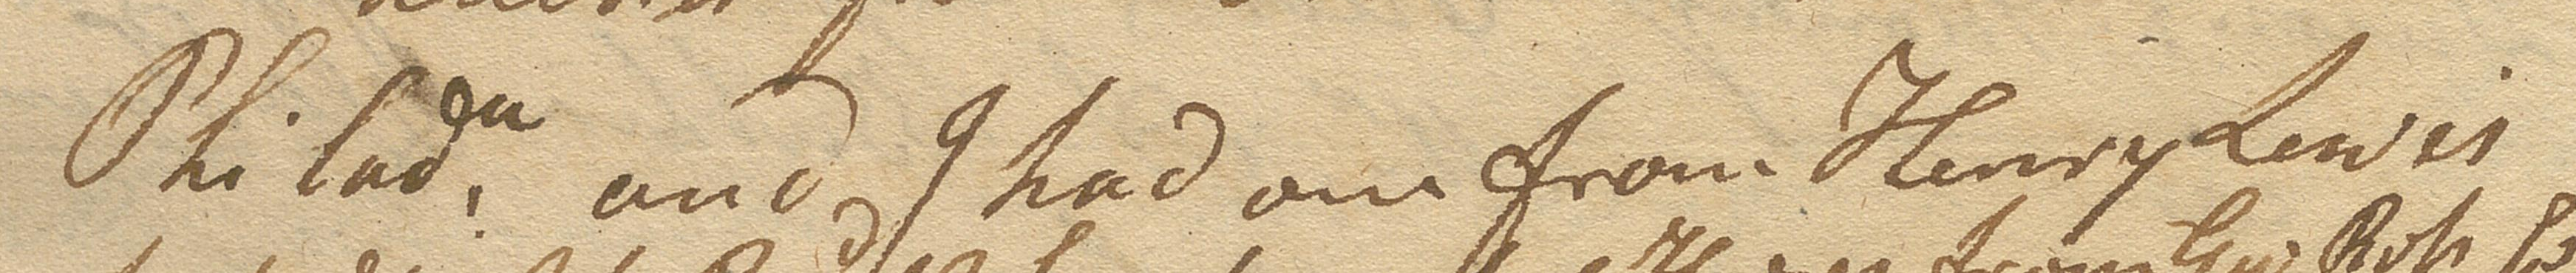Philad^a. and I had one from Henry Lewis
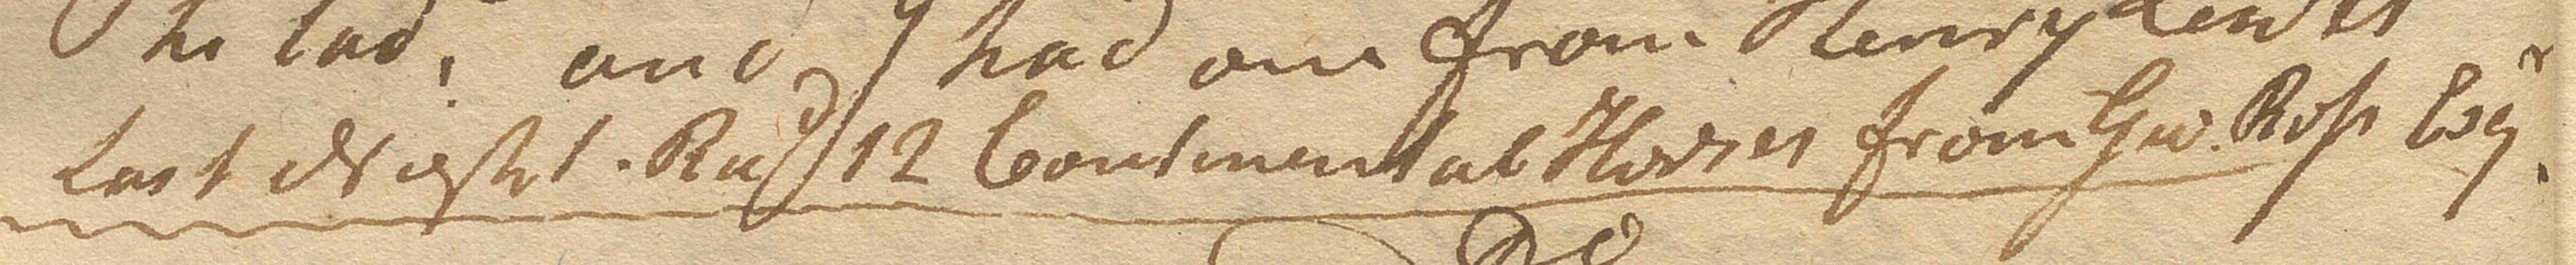Last Night. Rec^d 12 Continental Horses from Geo. Ross Esq^r.
